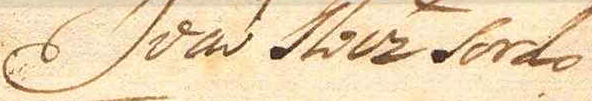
Joaõ Roiz̄ Sordo
